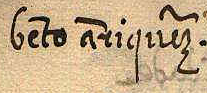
bēto āriquēz
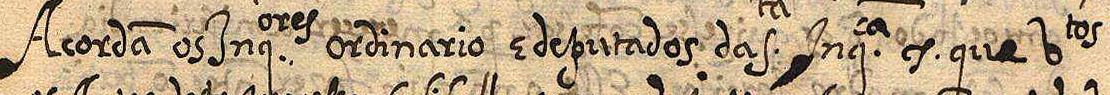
Acordā os Inq.ores ordinario E deputados da S.tā Jnq.çā cꝭ que v.tos
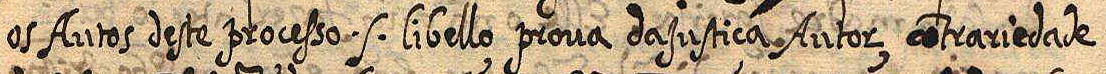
os Autos deste processo .s. libello proua da Justiça Autor cōtrariedade
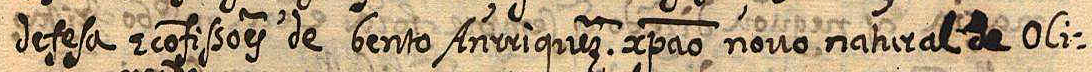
defesa E cōfissoẽs de bento Anrriquez̄ xpão nouo natural de Oli
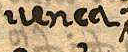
uença
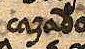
cazado
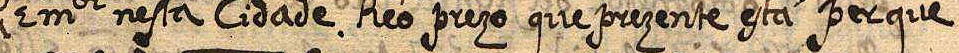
E mor nesta Cidade Reo prezo que prezente está per que
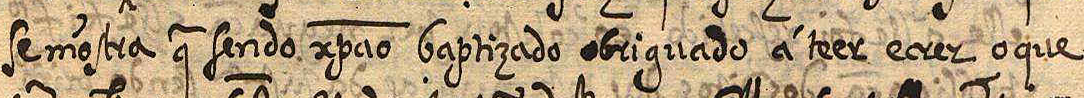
se mostra q̅ sendo xpão baptizado obriguado a teer e crer o que
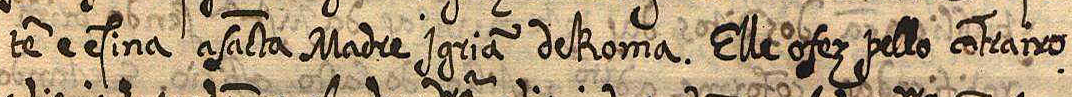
tē e ēsina a sācta Madre Jgriā de Roma. Elle o fez pello cōtrairo
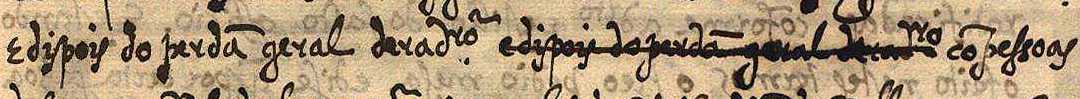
E dispois do perdā geral deradro e dispois de perdā geral deradro cō pessoas
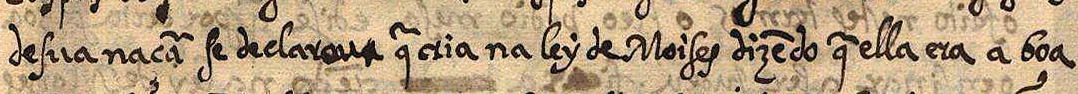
de sua naçā se declaraua q̅ cria na ley de Moises dizēdo q̅ ella era a boa
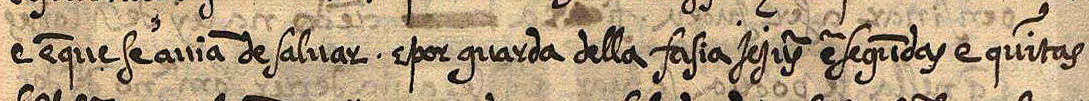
e ē que se auiā de saluar. E por guarda della fasia jejūs ē segūdas e quītas
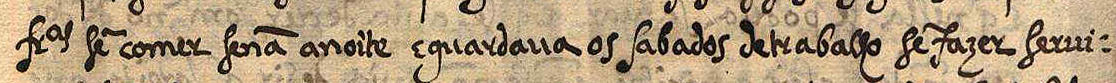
fras sē comer senā a noite E guardaua os sabados de trabalho sē fazer serui
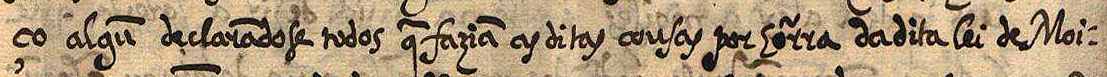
ço algū declarādose todos q̄ faziā as ditas cousas por hōrra da dita lei de Moi
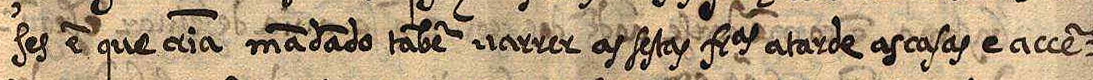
ses ē que criā mādādo tābē uarrer as sestas fras a tarde as casas e accē
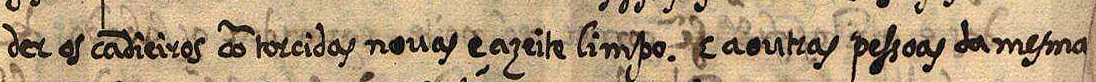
der os cādieiros cō torcidas nouas, e azeite limpo. E a outras pessoas da mesma
